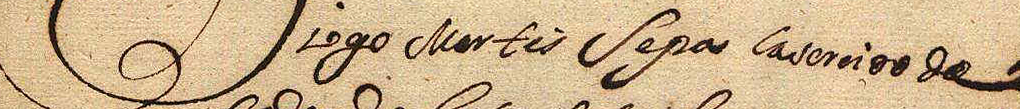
Diogo Martis Sepa casereiro da
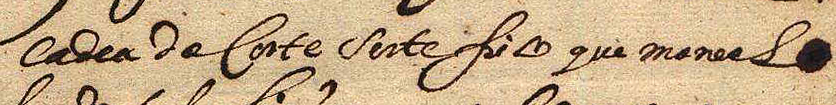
cadea da Corte sertefico que manoel
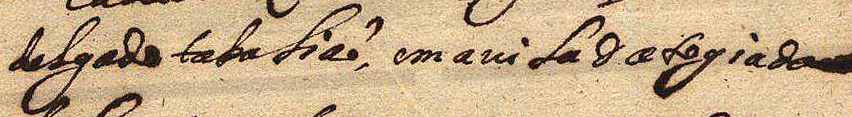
delgado tabaliaõ, em a uila datogia da
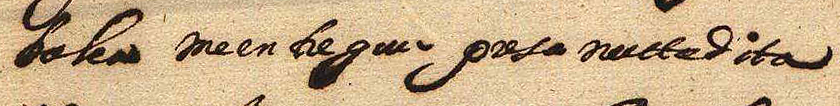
balea me entregou presa nestta dita
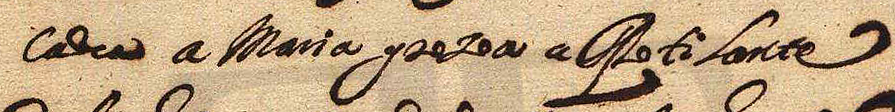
cadea a Maria grojoa a Quotilante
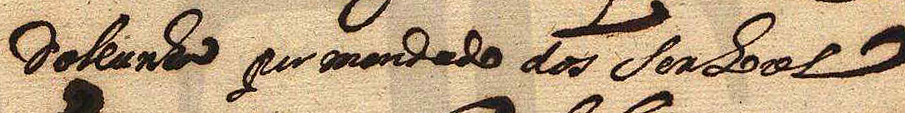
dalcunho per mandado dos Senhores
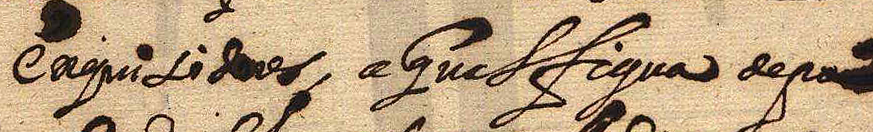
enquisidores, a qual fiqua de po
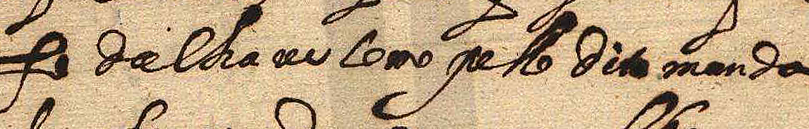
sse da chaue como pello dito manda
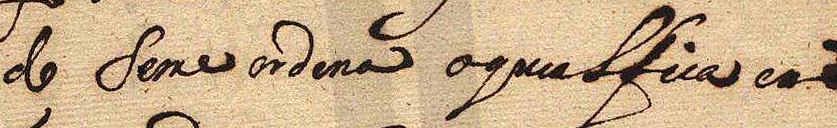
do, se me ordena o quaL fica em
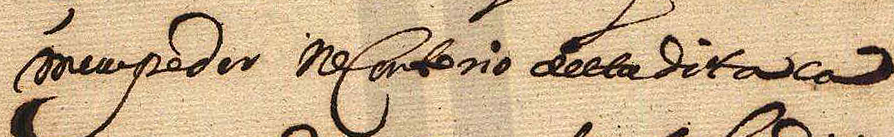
meu poder no Cartorio desta dita ca
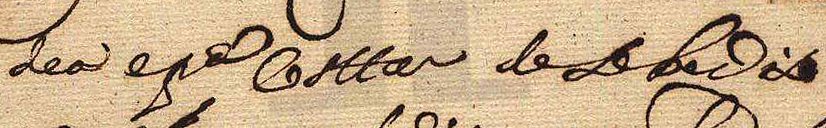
dea e p.a costtar do sobedito
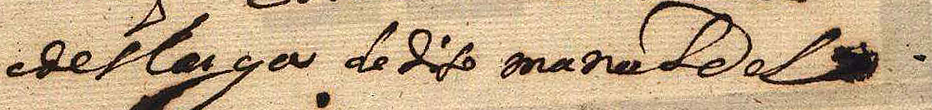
e descarga do dito manoel del
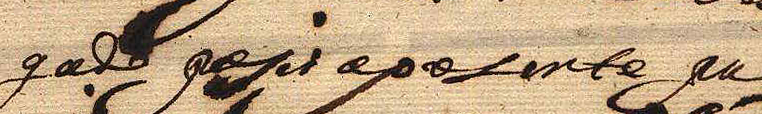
gado pasei a presente por
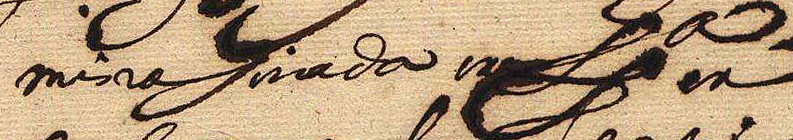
min asinada en Lxa en
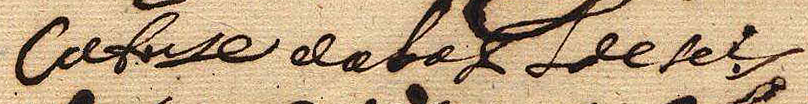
catorse dabriL de seis
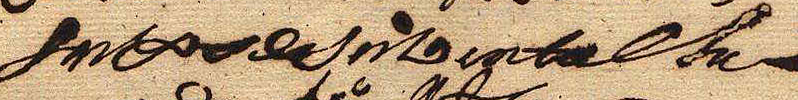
sentos e sincoenta e hu
